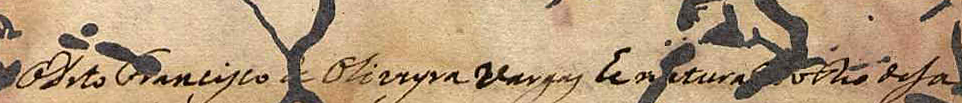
O dito Francisco de Oliveyra Vargas he natural _o Rio de Ja
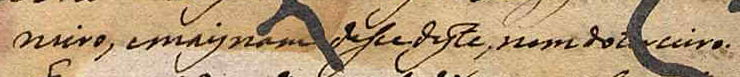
neiro, e mais nam disse deste, nem do terceiro.
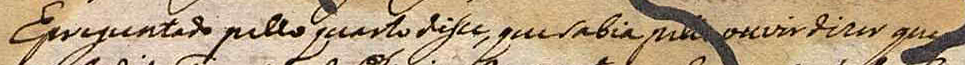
E preguntado pello quarto disse, que sabia pelo ouvir dizer que
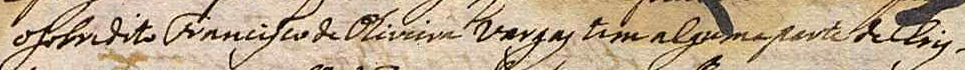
o sobredito Francisco de Oliveira Vargas tem alguma parte de Chris
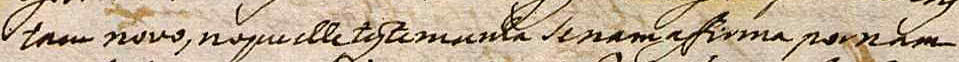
tam novo, no que elle testemunha se nam affirma por nam
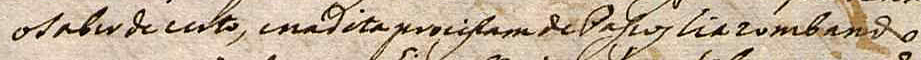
o saber de certo, e na dita procissam de Passos hia zombando
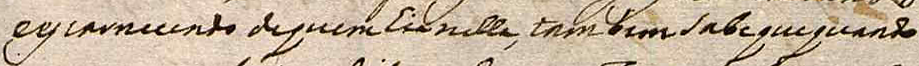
e escarnecendo de quem hia nella, tambem sabe que quando
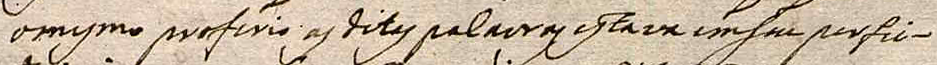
o mesmo proferio as ditas palavras estava em seu perfei
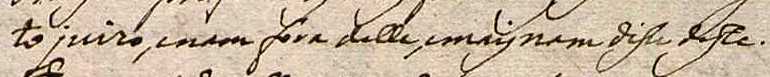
to juizo, e nam fora delle, e mais nam disse deste.
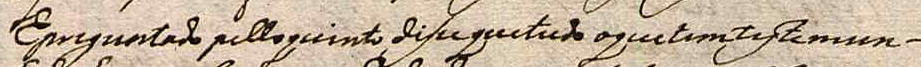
E preguntado pello quinto disse que tudo o que tem testemun
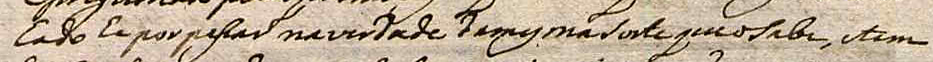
hado he por passar na verdade da mesma sorte que o sabe, e tem
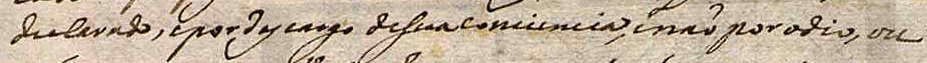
declarado, e por descargo de sua conciencia, e naõ por odio, ou
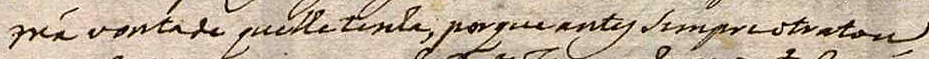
má vontade que lhe tenha, porque antes sempre o tratou,
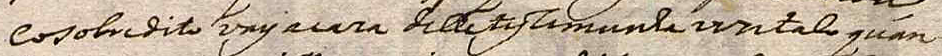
e o sobredito vay a caza delle testemunha vizitalo quan
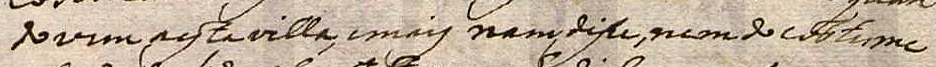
do vem a esta villa, e mais nam disse, nem do costume
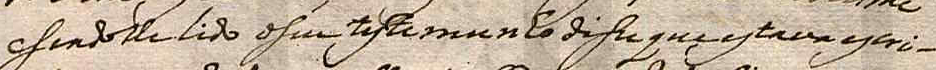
e sendolhe lido o seu testemunho disse que estava escri
